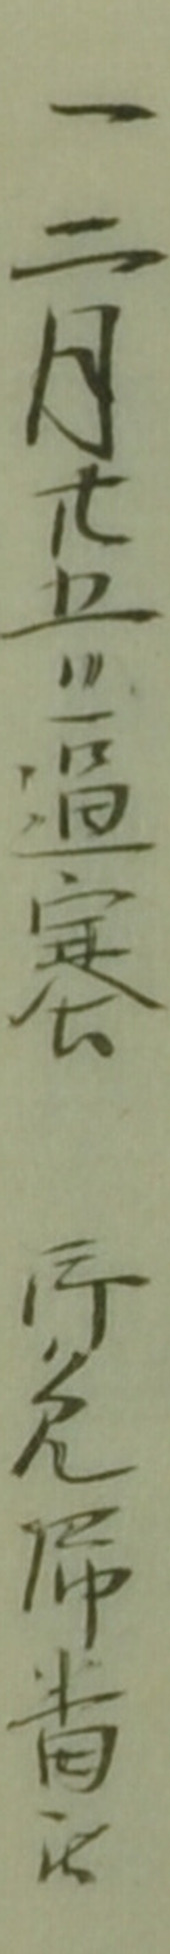一二月廿五日逼塞御免帰番被
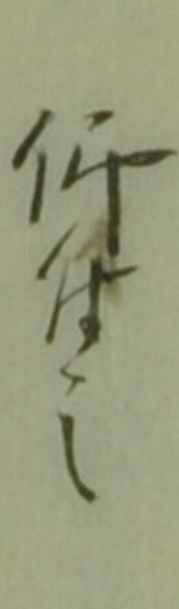仰付之
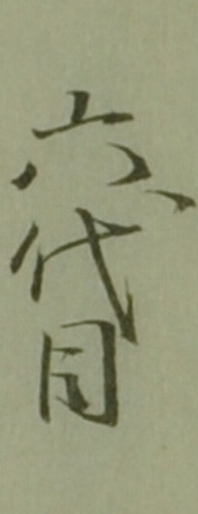六代目
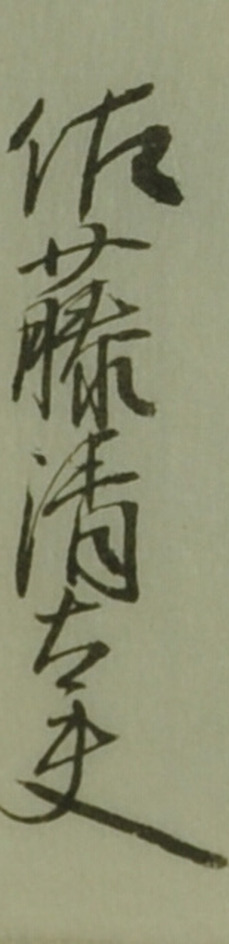佐藤清太夫
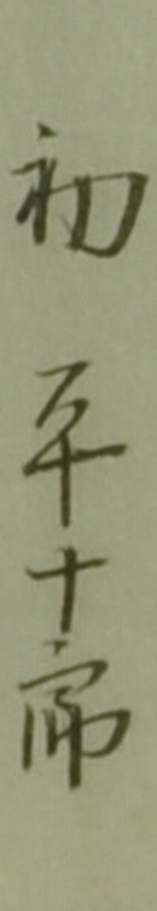初平十郎
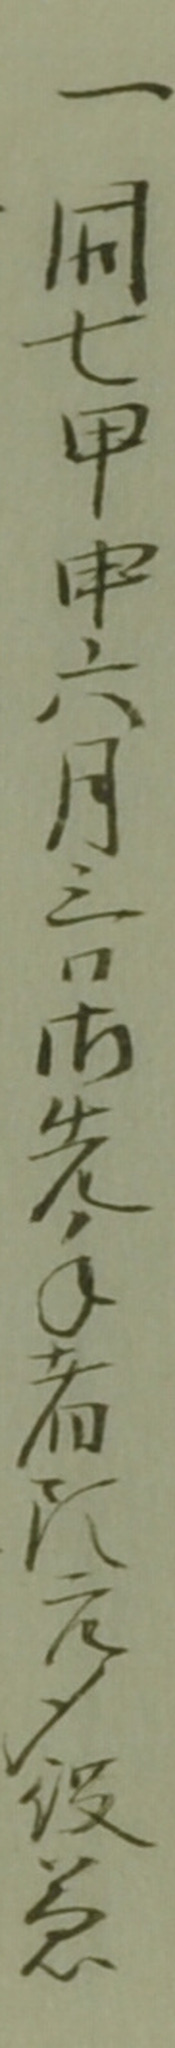一同七甲申六月三日御先手者頭元〆役兼
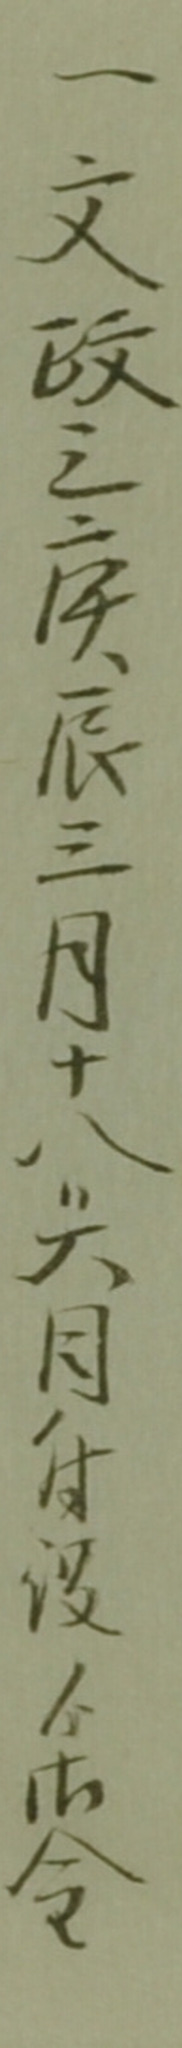一文政三庚辰三月十八日大目付役ゟ御金
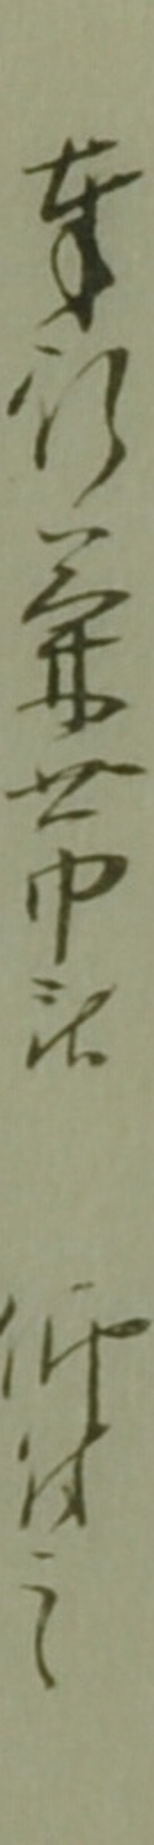奉行兼帯被仰付之
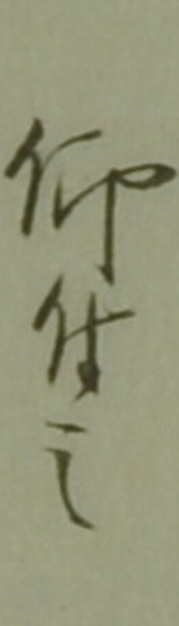仰付之
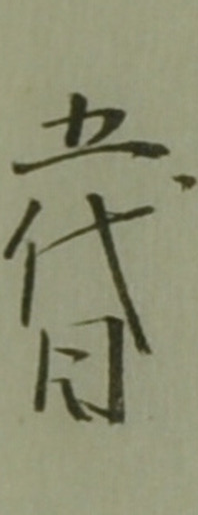五代目
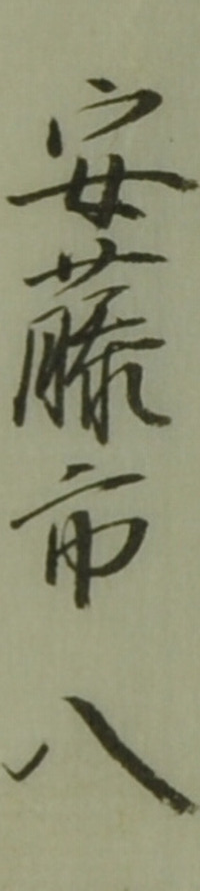安藤市八
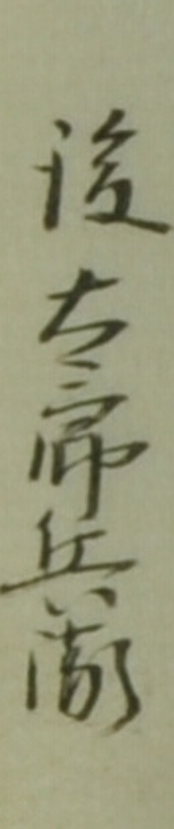後太郎兵衛

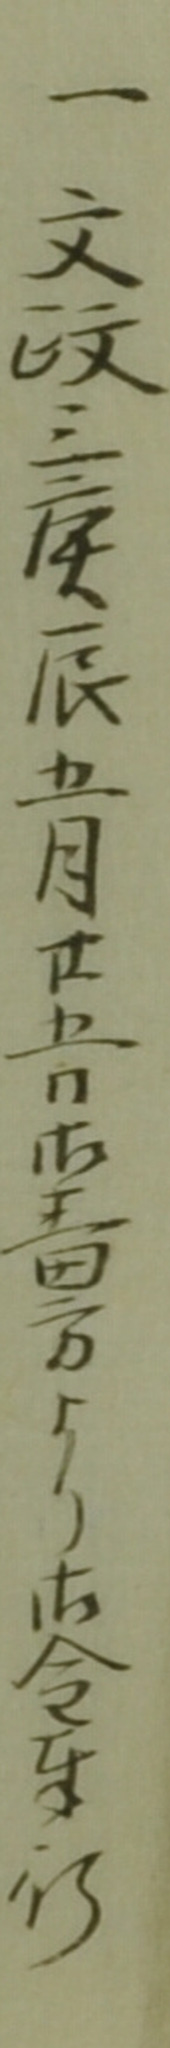一文政三庚辰五月廿五日御番方より御金奉行
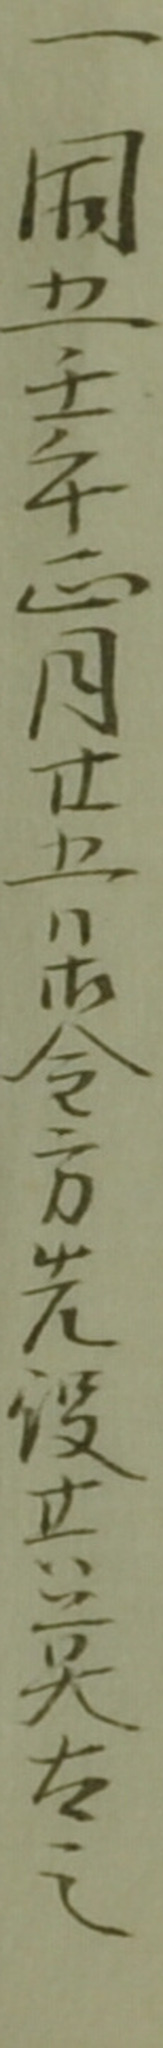一同五壬午正月廿五日御金方先役共莫大之
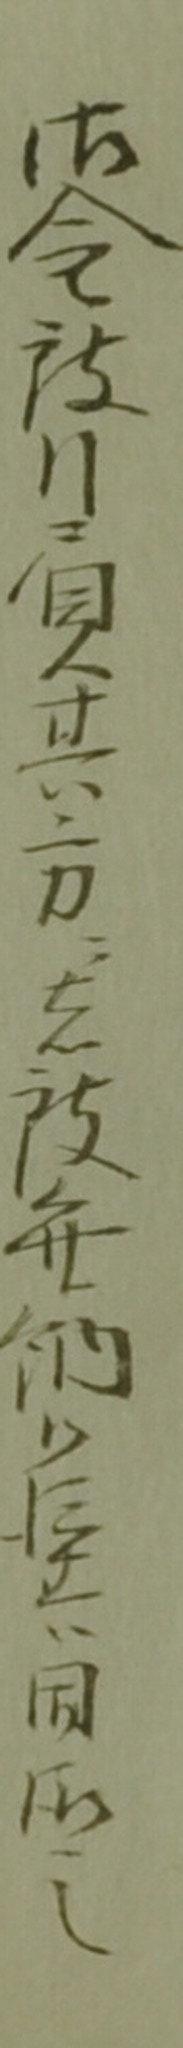御金致引負其方者致弁納候得共同様之
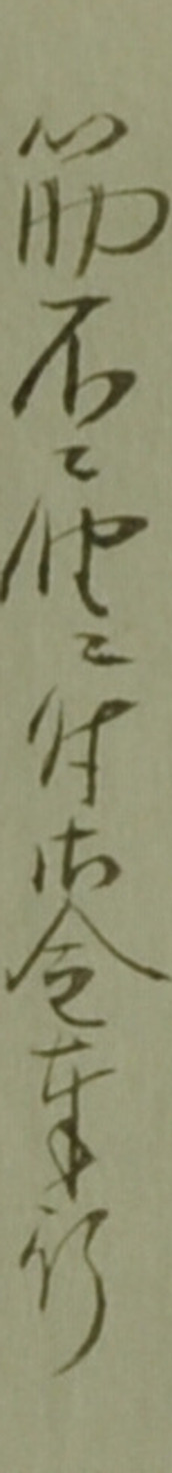筋不届付御金奉行
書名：諸御役代々録（七）
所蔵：伊那市立高遠町図書館・合同会社AMANE
